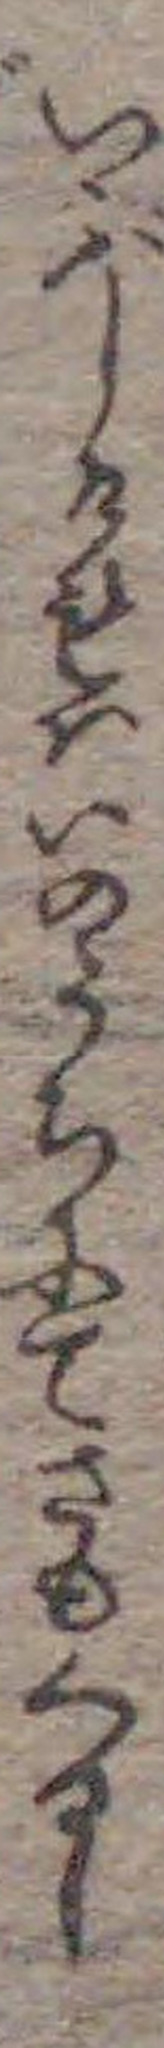いぶしけれはいのうちにてさもくるし
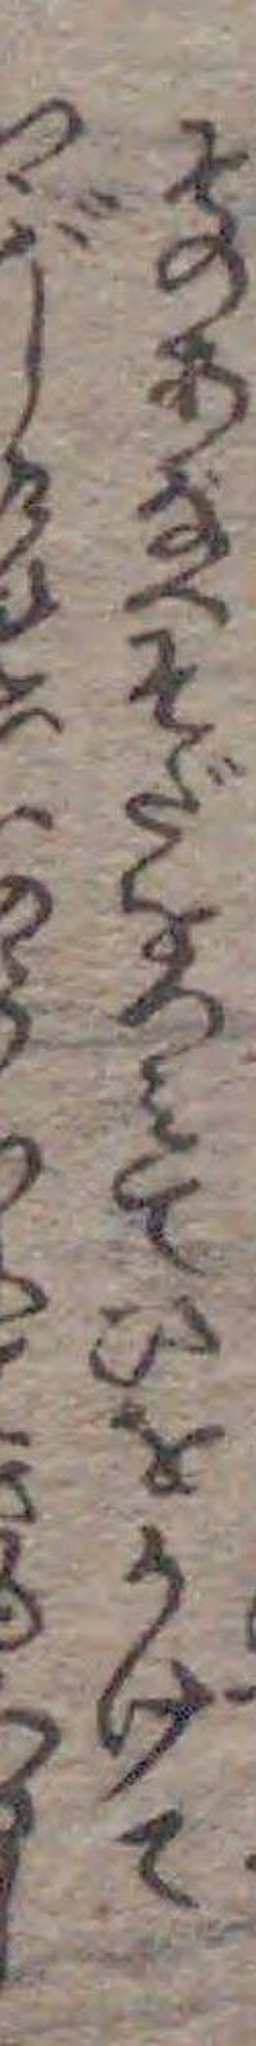いぶしけれはいのうちにてさもくるし
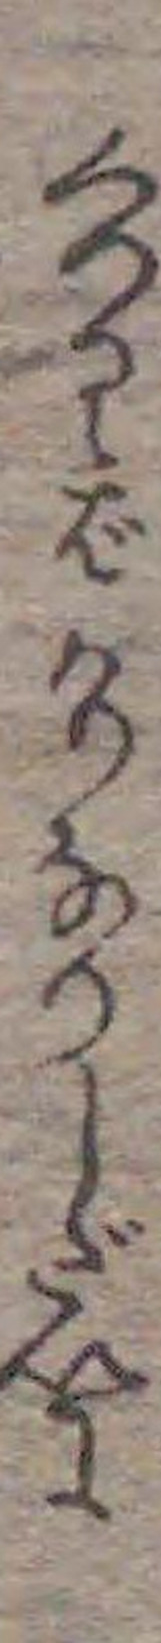くつるゝばかりなりしだいに
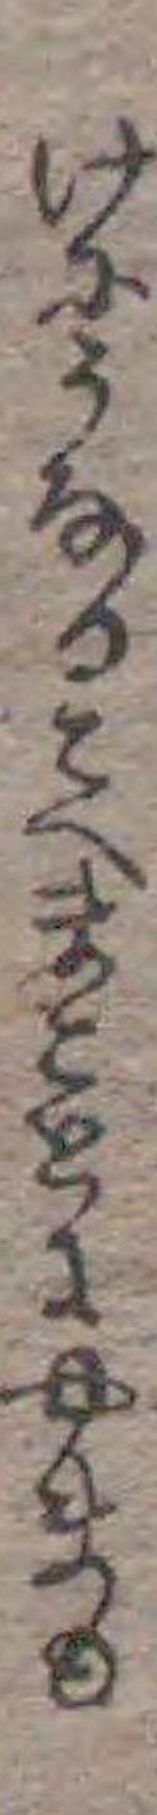げにうなるこへまことにやんまも
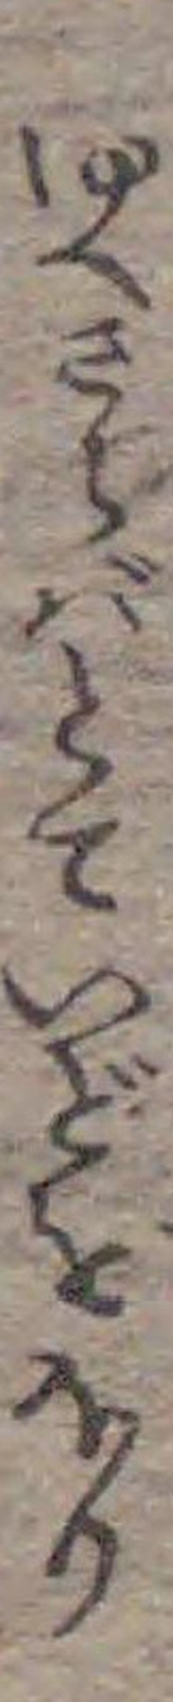ゆへさらばとていどをほり
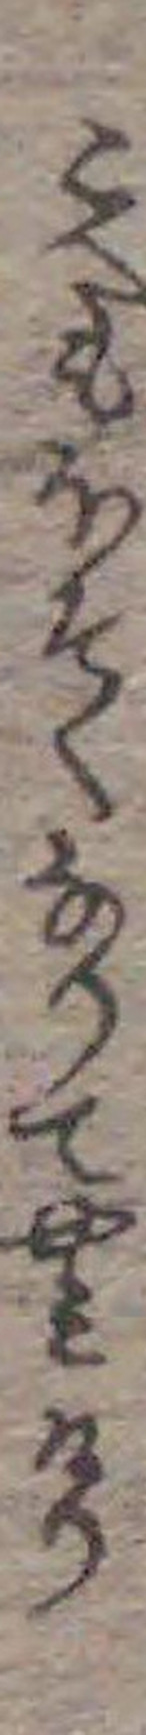こへもほそくなりてやみけり
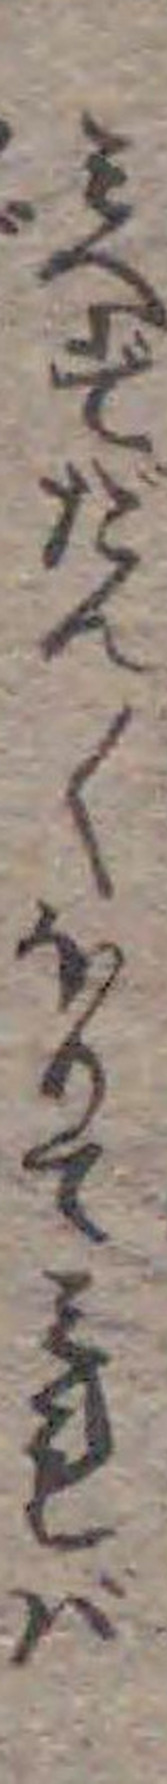みへずだん〳〵ほりてみれば
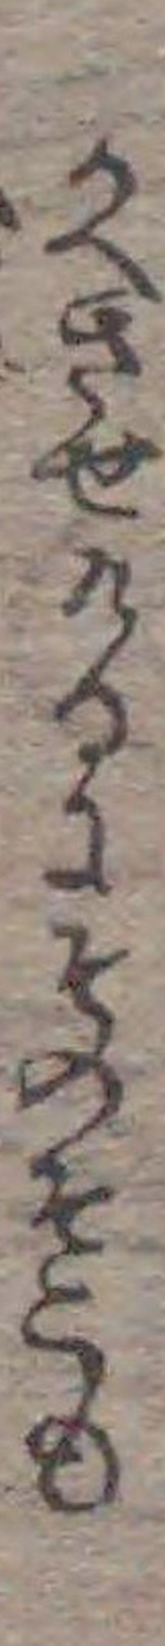かへさせけるにそのそこも
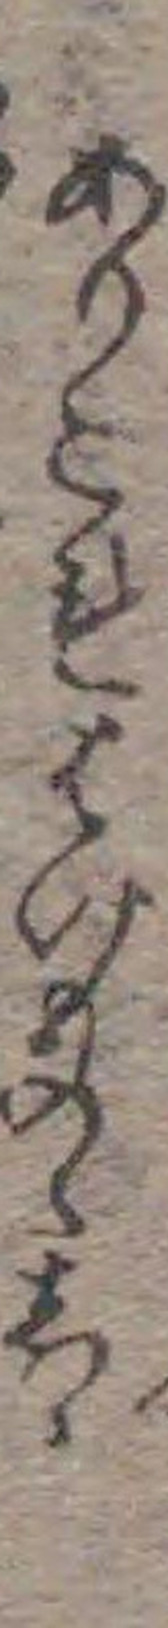ありこれはけものゝしゝ
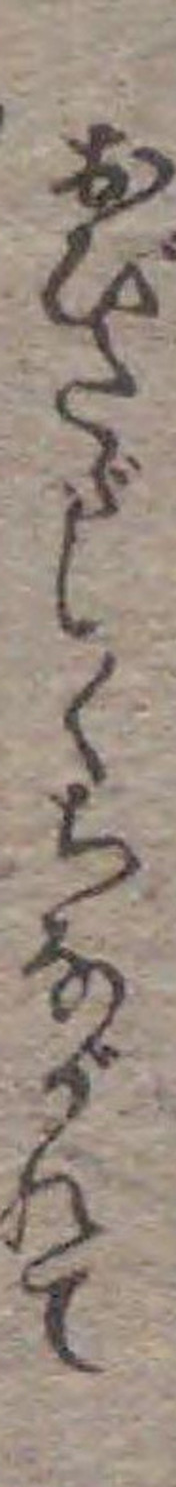おびたゞしくちながれて
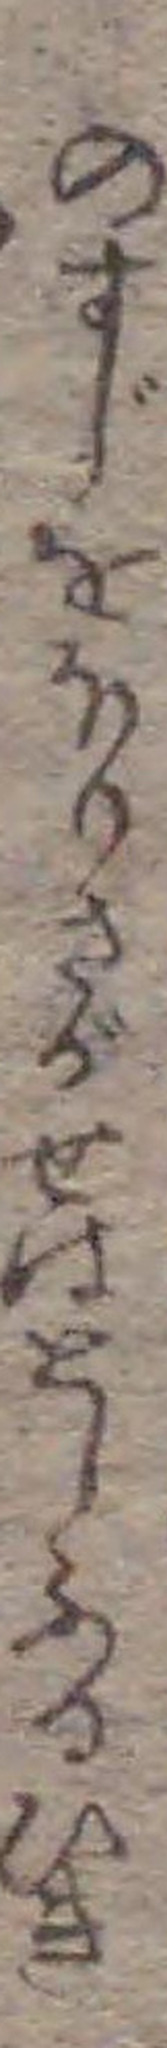のすじをほりさがせはとしふるひき
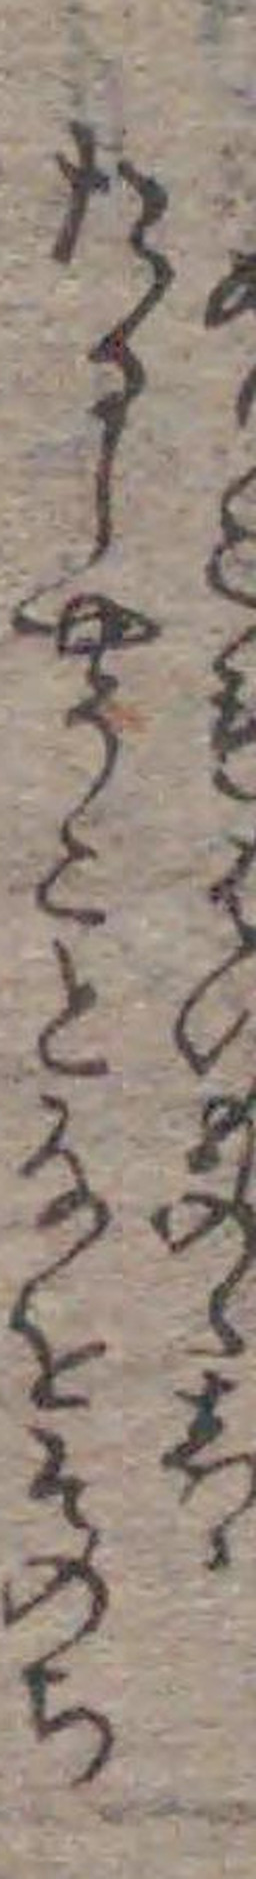たるしやうことなをそのち
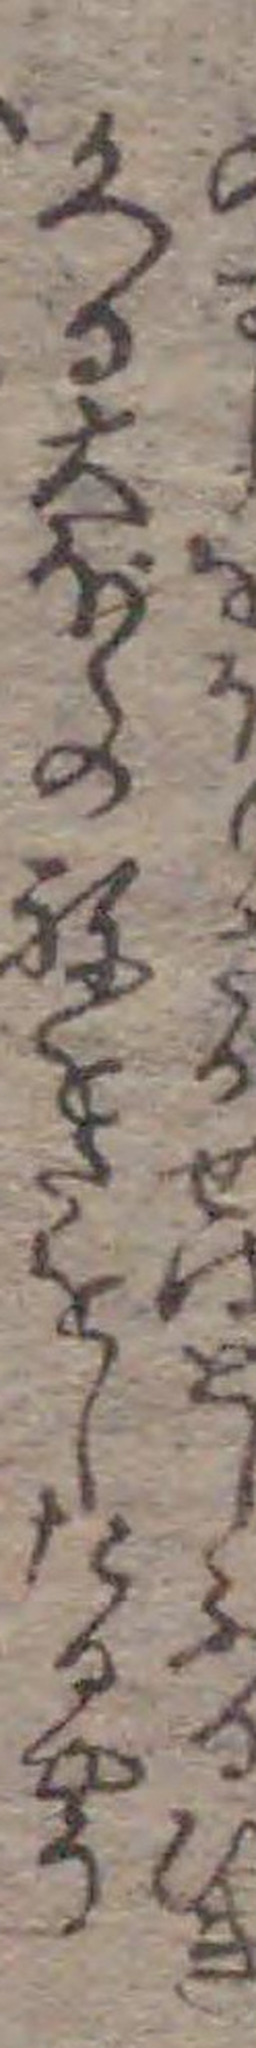かへる大ぼくのねをたをしたるやう
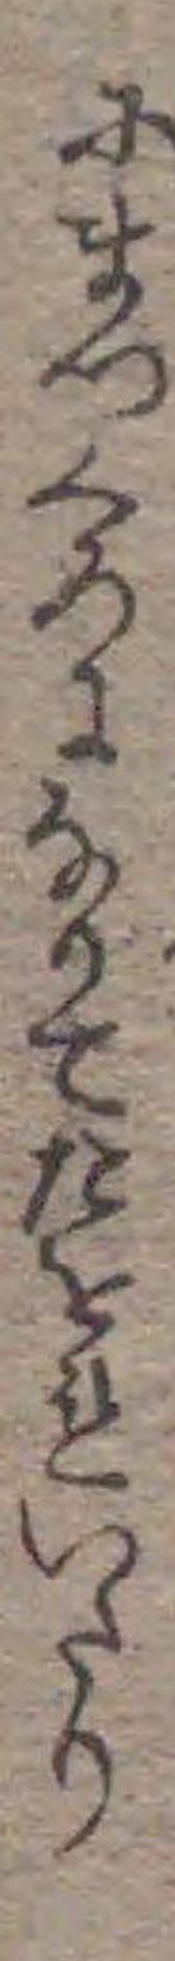にまつくろになりてたをれいたり

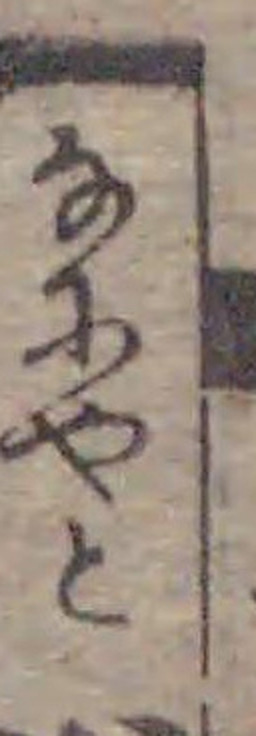なにやと
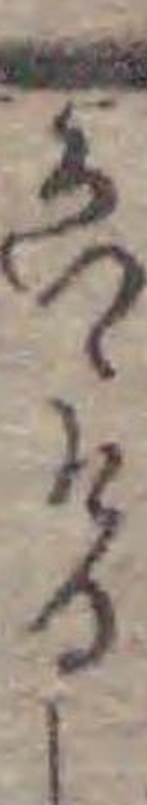かいゝける
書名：変化物春遊 : 2巻
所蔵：国立国会図書館 National Diet Library, JAPAN
